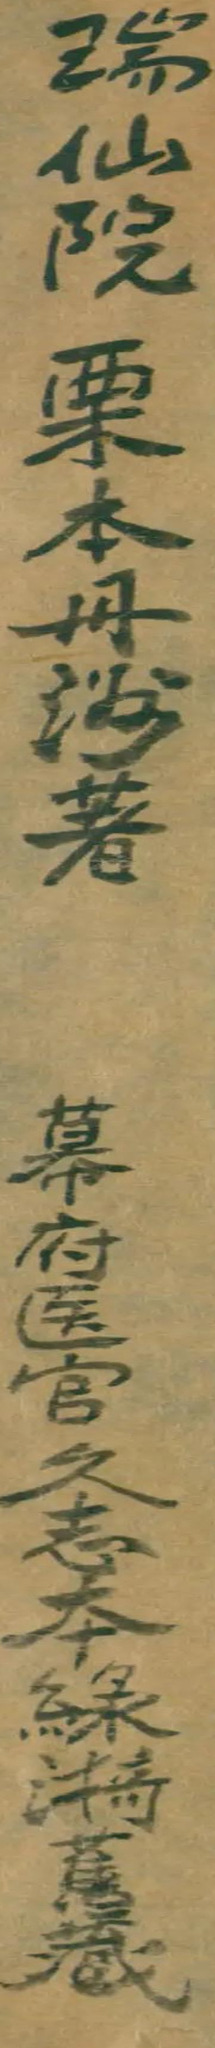瑞仙院栗本丹洲著幕府医官久志本緑漪旧蔵
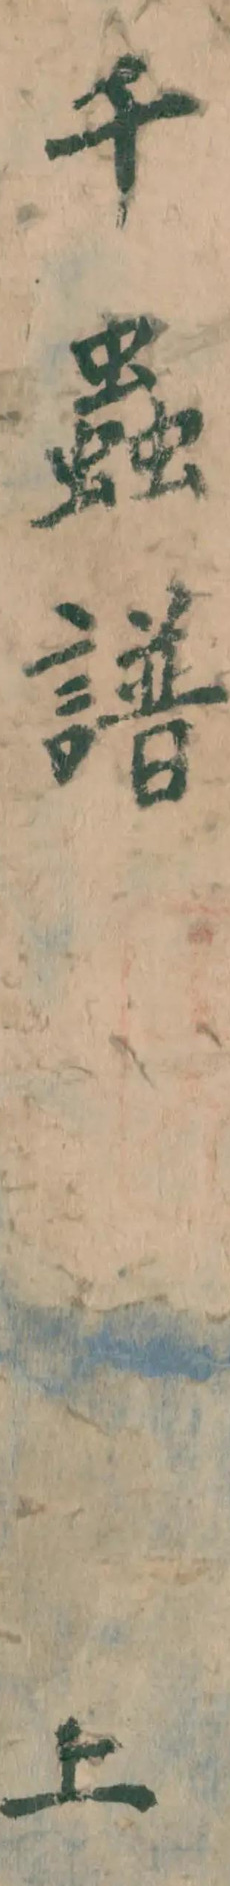千蟲譜上

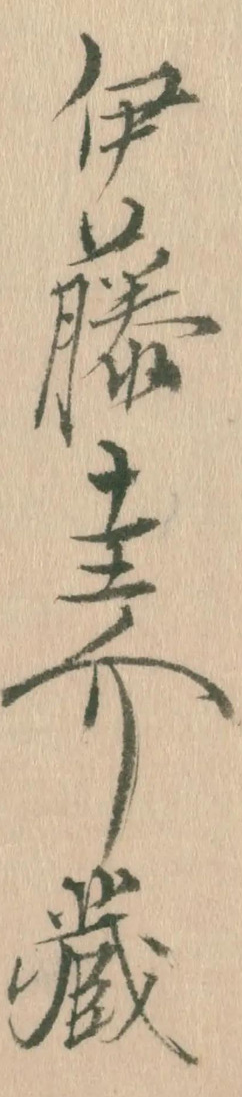伊藤圭介蔵

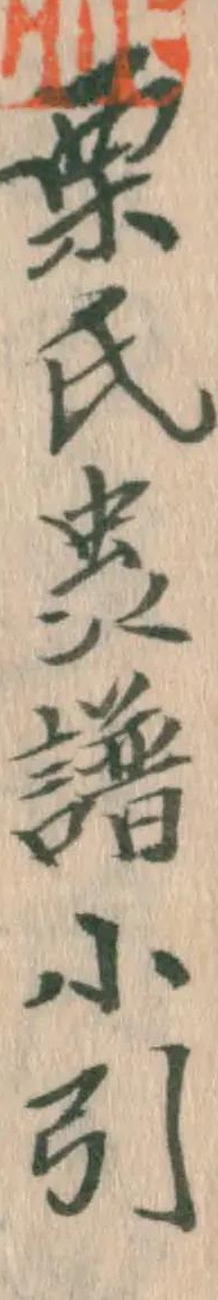栗氏蟲譜小引
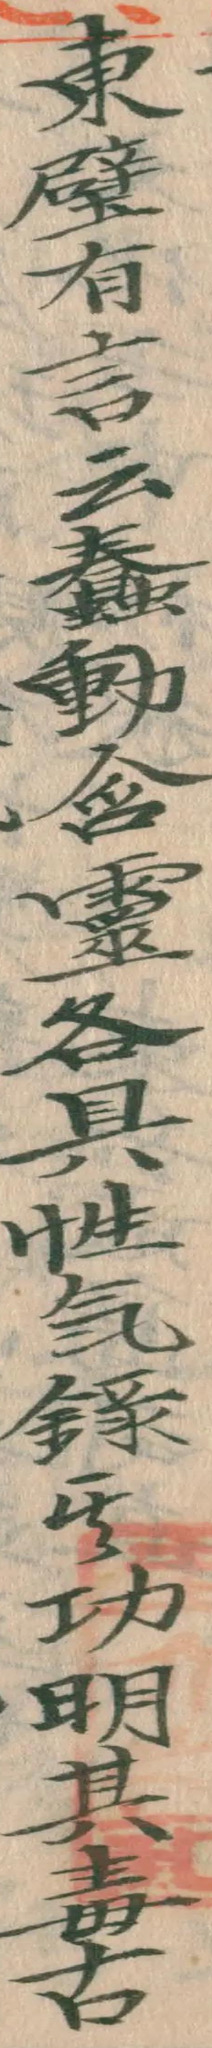東璧有言云蠢動含靈各具性気錄其功明其毒古
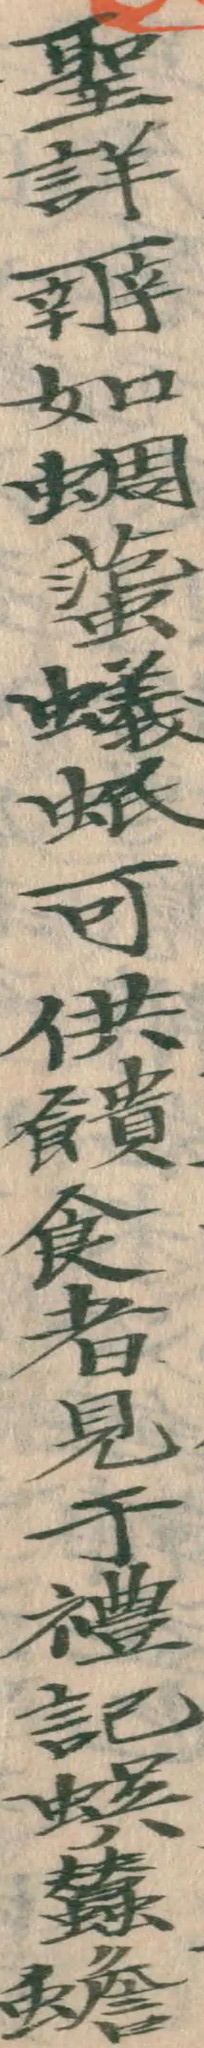聖詳辨如蜩𧍙蟻蚔可供饋食者見于禮記蜈蠺蟾
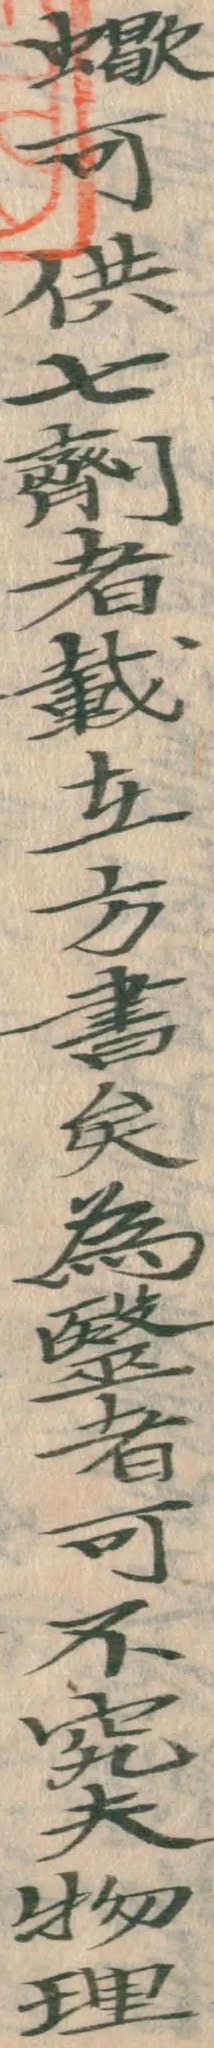蠍可供七劑者載在方書矣為毉者可不究夫物理
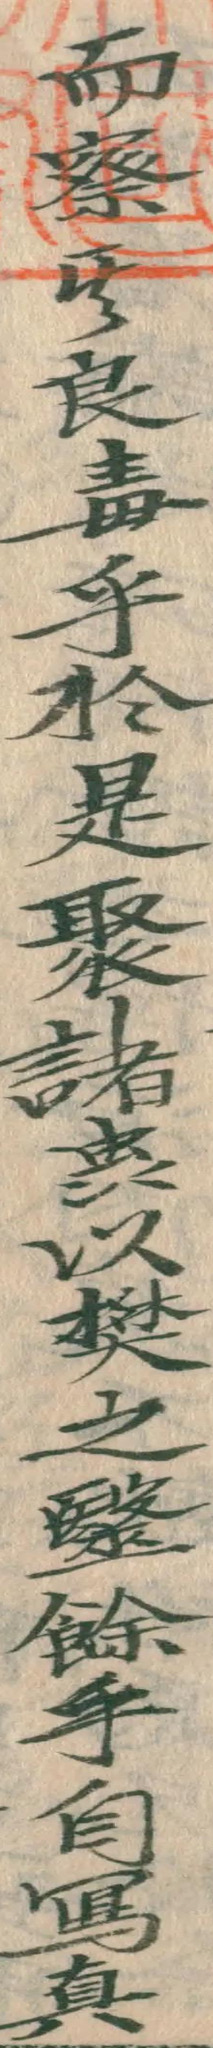而察其良毒乎於是聚諸蟲以樊之毉餘乎自冩真
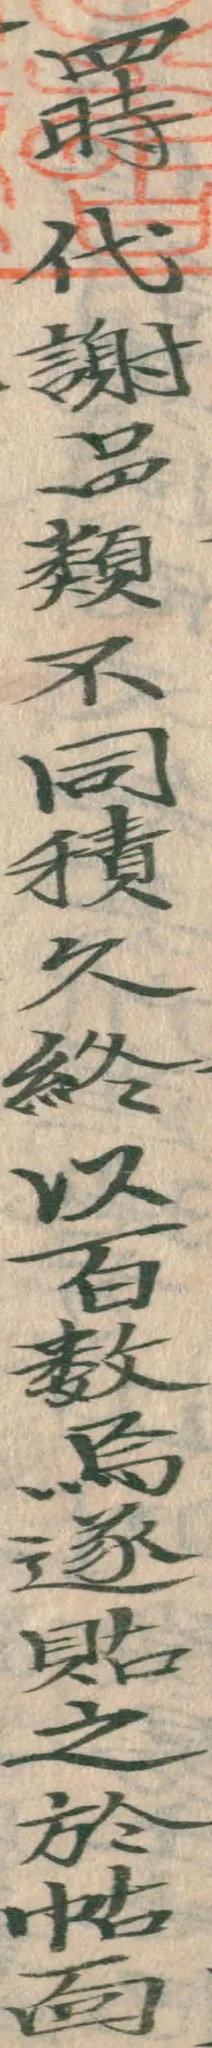四時代謝品類不同積久終以百数焉遂貼之於帖靣
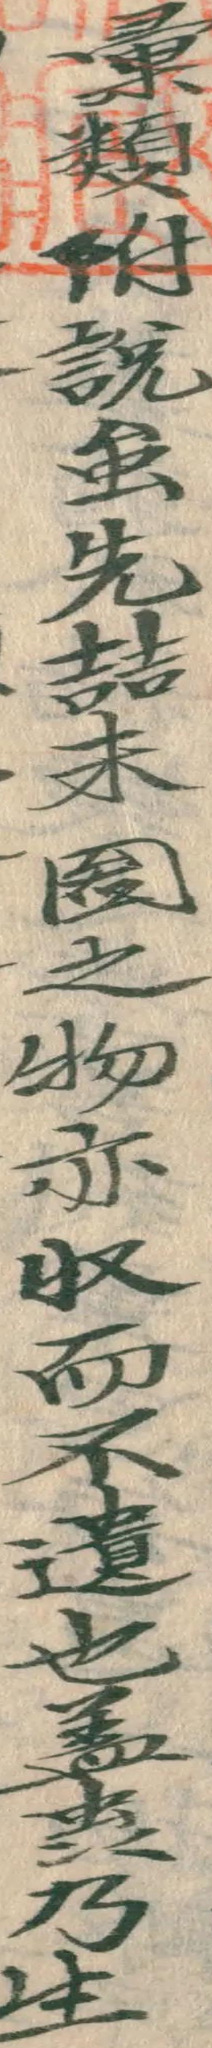彙類附説虽先喆未圗之物亦収而不遺也蓋蟲乃生
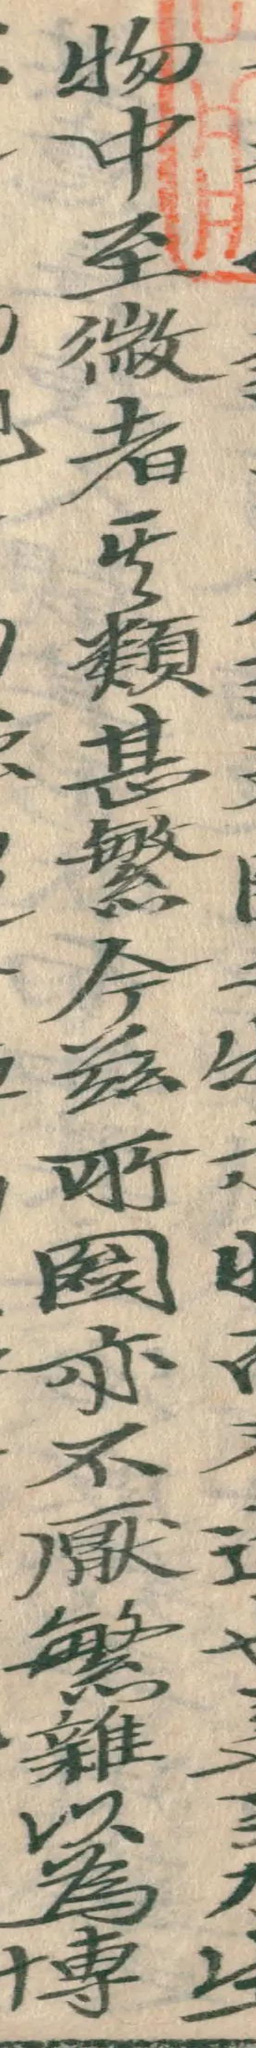物中至微者其類甚繁今茲所圗亦不厭繁雜以為博
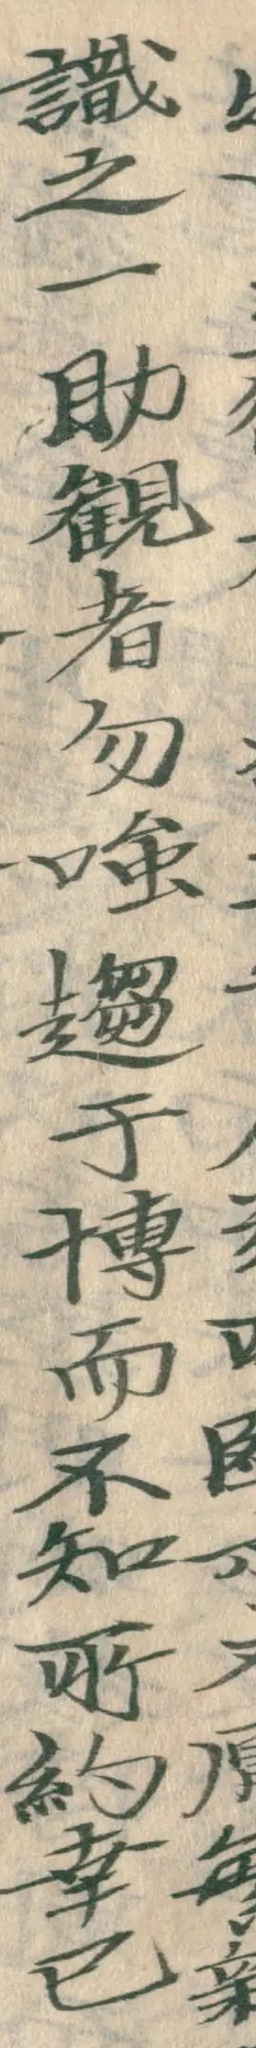識之一助観者勿嗤趨于博而不知所約幸已
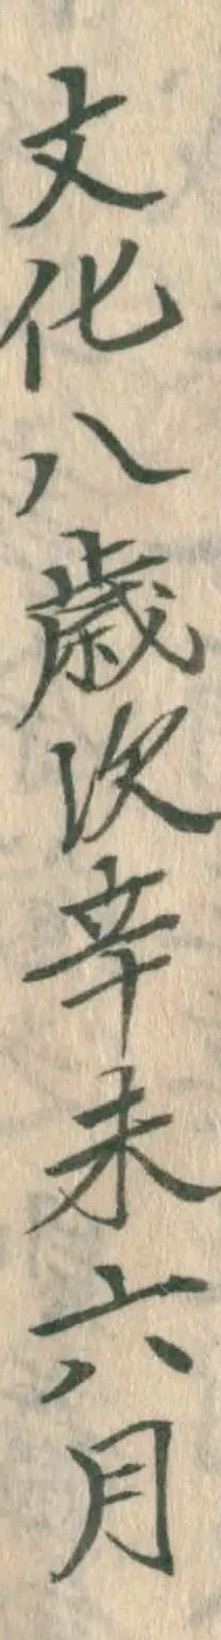文化八歳次辛未六月
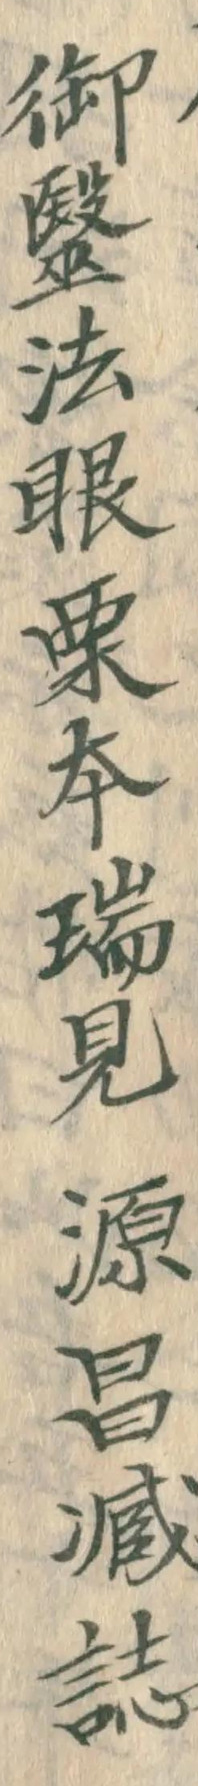御毉法眼栗本瑞見源昌臧誌

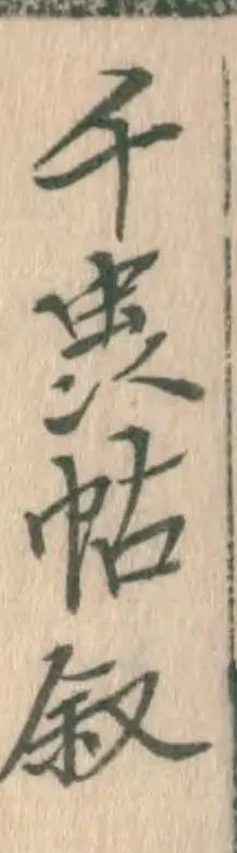千蟲帖叙
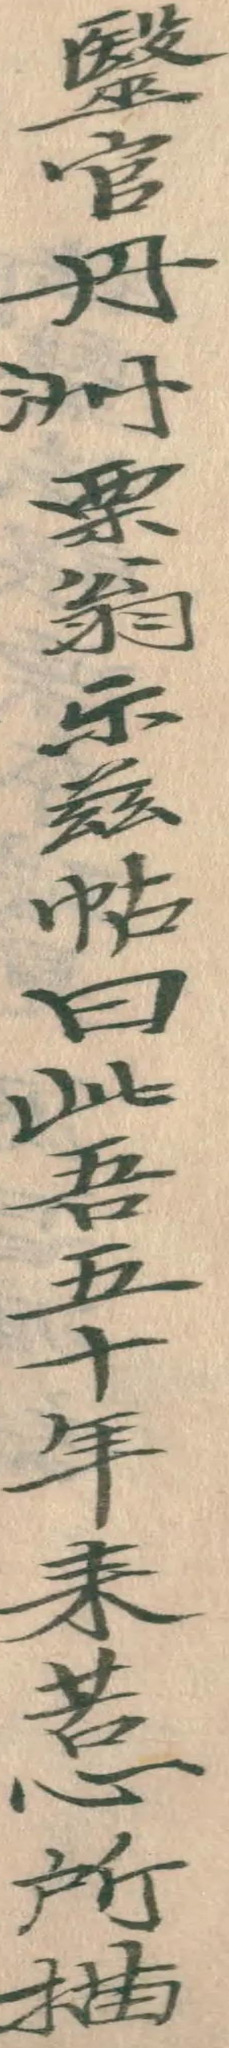毉官丹洲栗翁示茲帖曰此吾五十年来苦心所描
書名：千蟲譜 3巻. [1]
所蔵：国立国会図書館 National Diet Library, JAPAN
